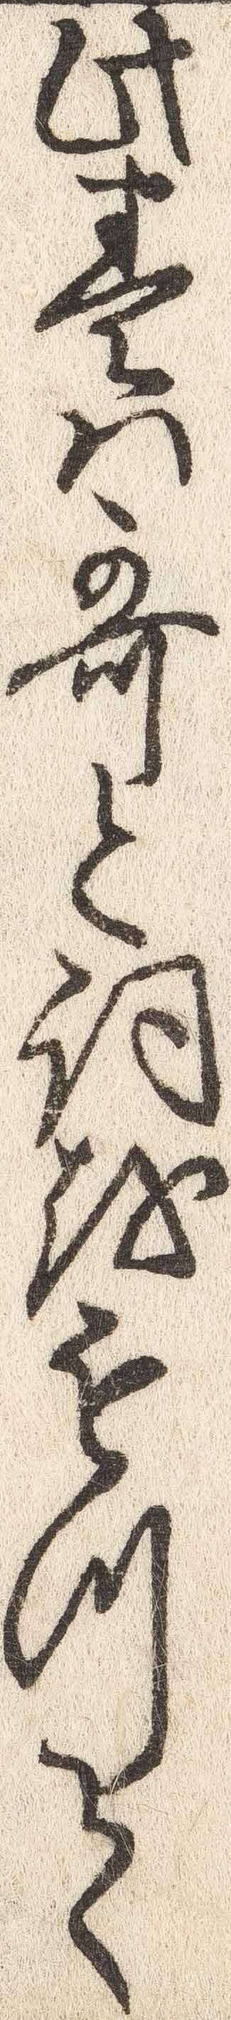此巻は歌と詞をもつて
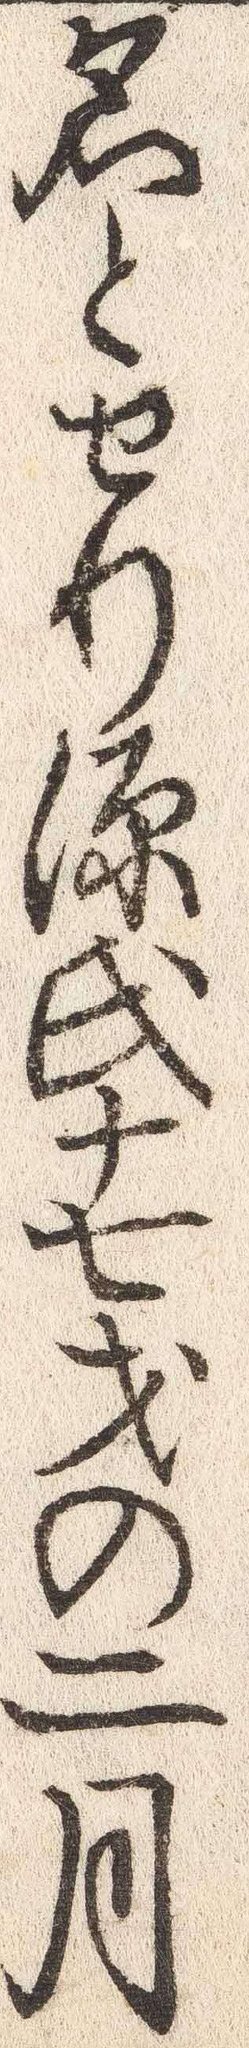名とせり源氏十七才の二月
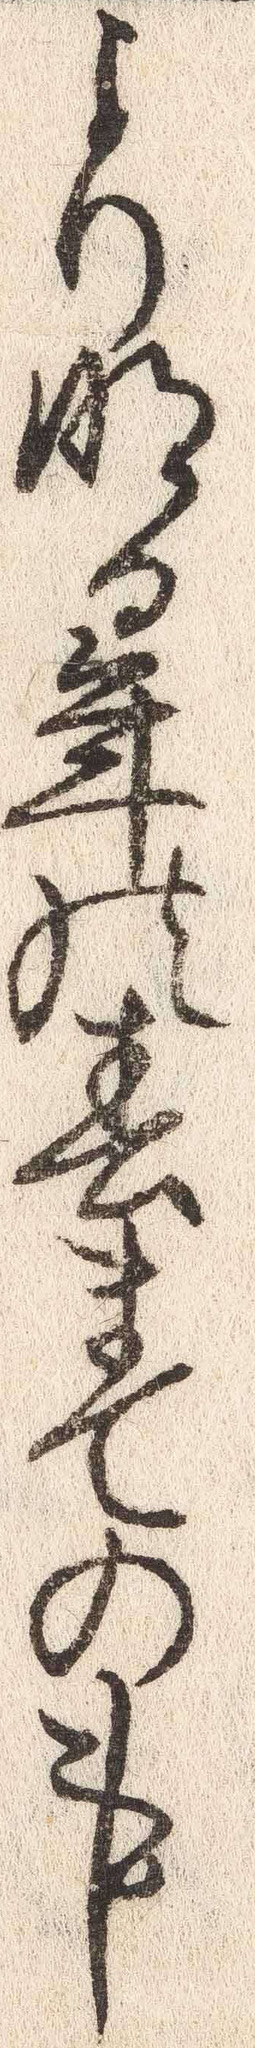より明る年の春まての事
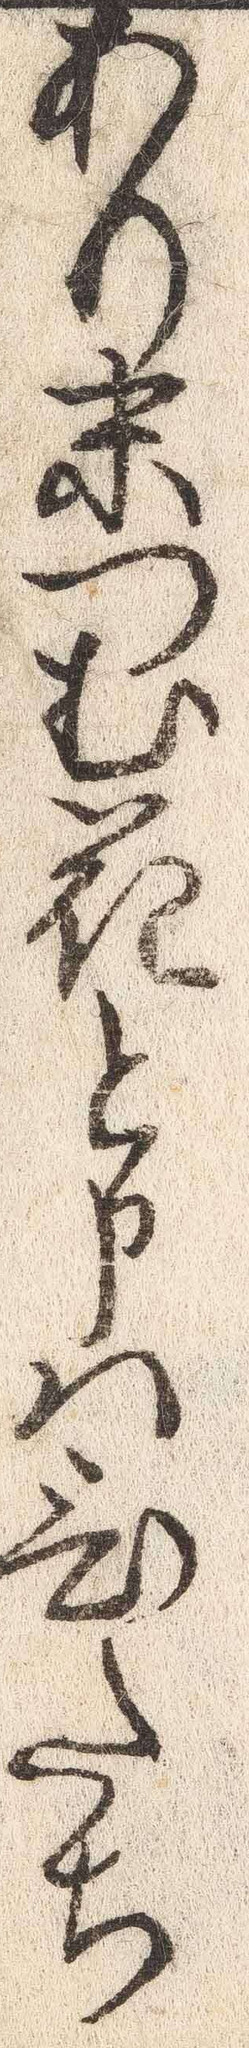あり末つむ花と申はひたち
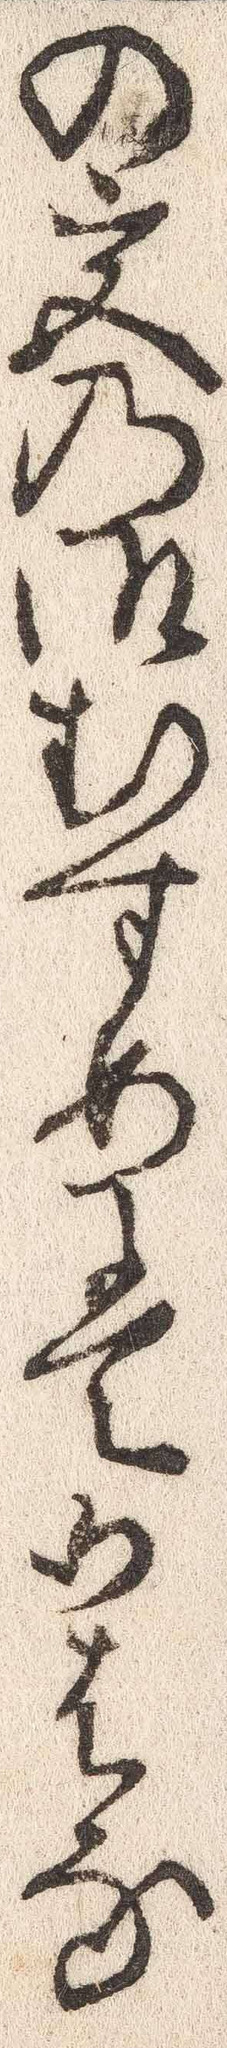の宮の御むすめにてめはな
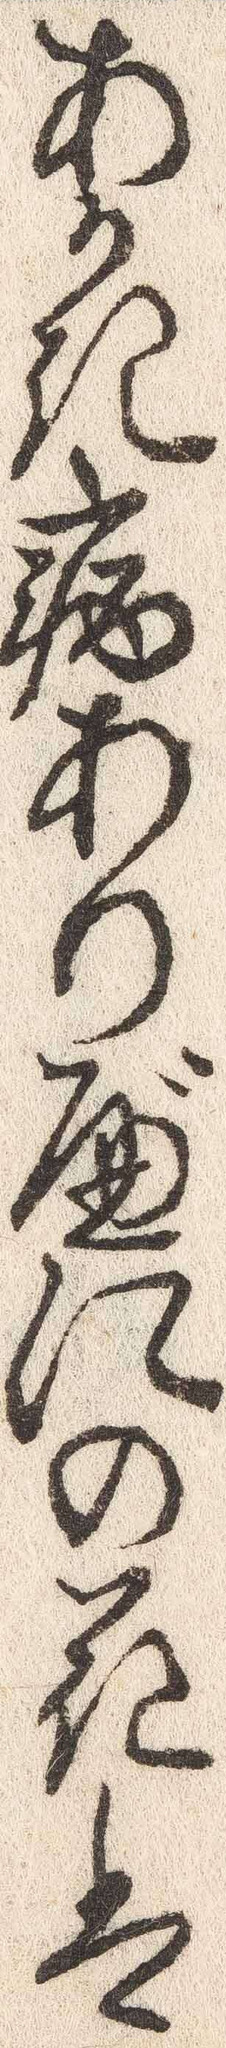あかき病ありべにの花は
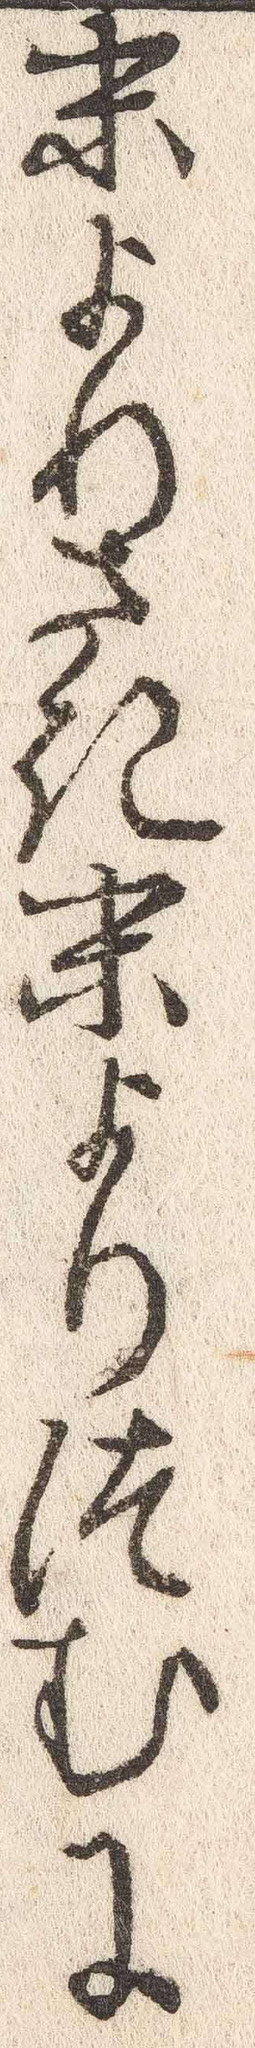末よりさき末よりつむに
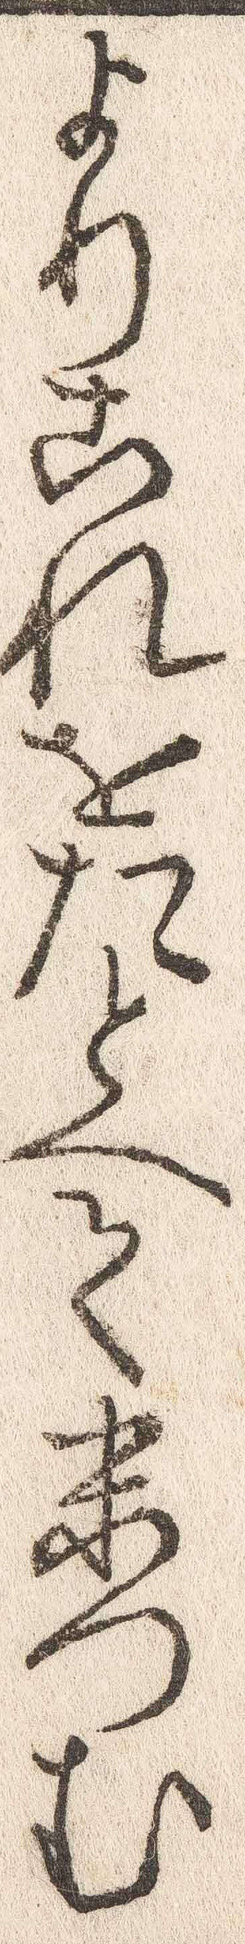よりこれをたとへて末つむ
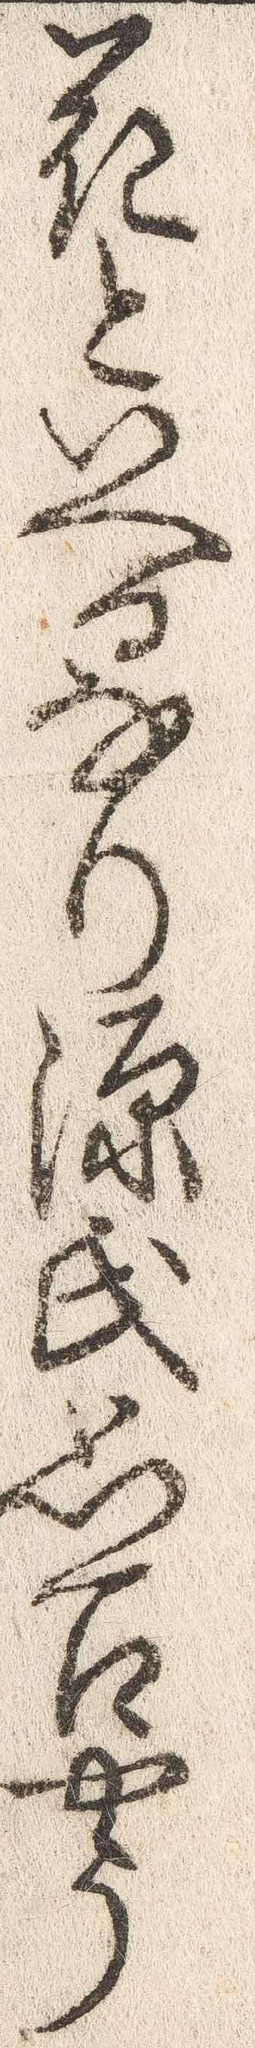花といへるなり源氏思召やう

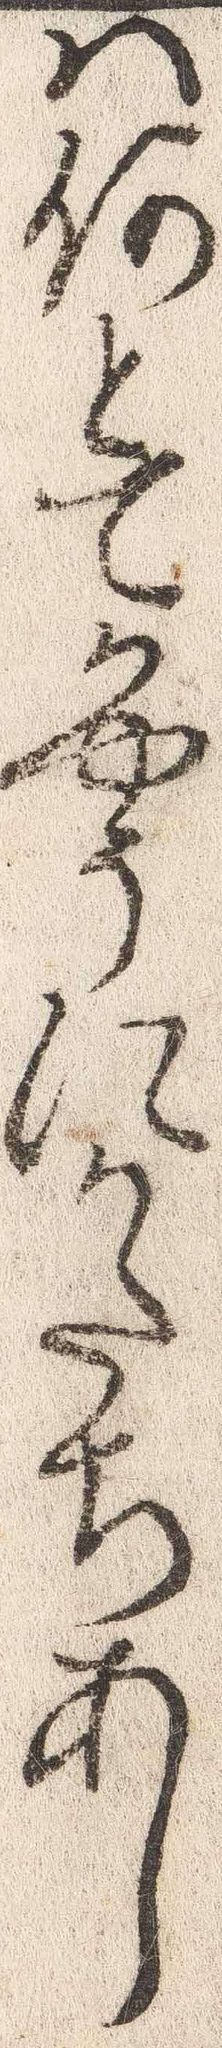は何とてかやうにかたちあし
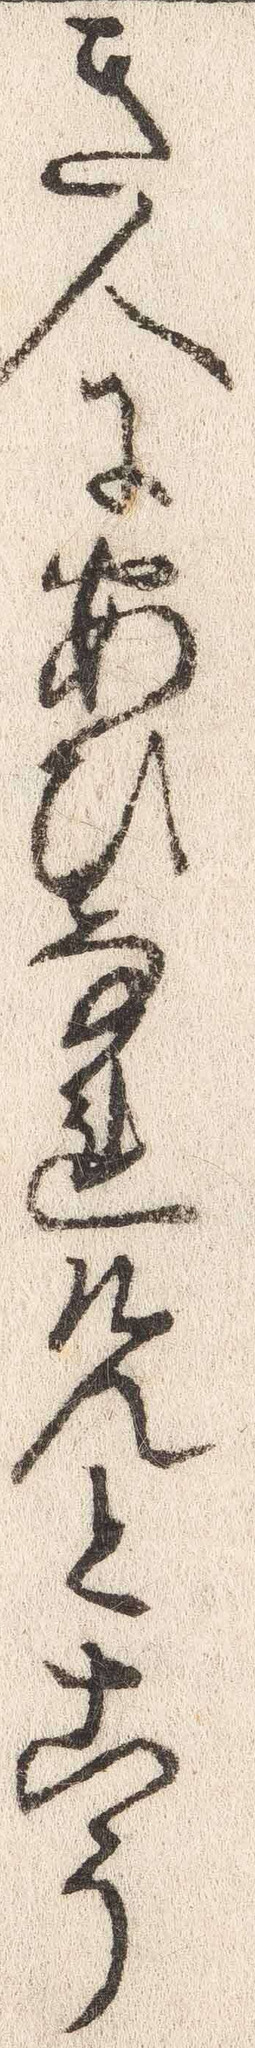き人にあひなれけんとこう
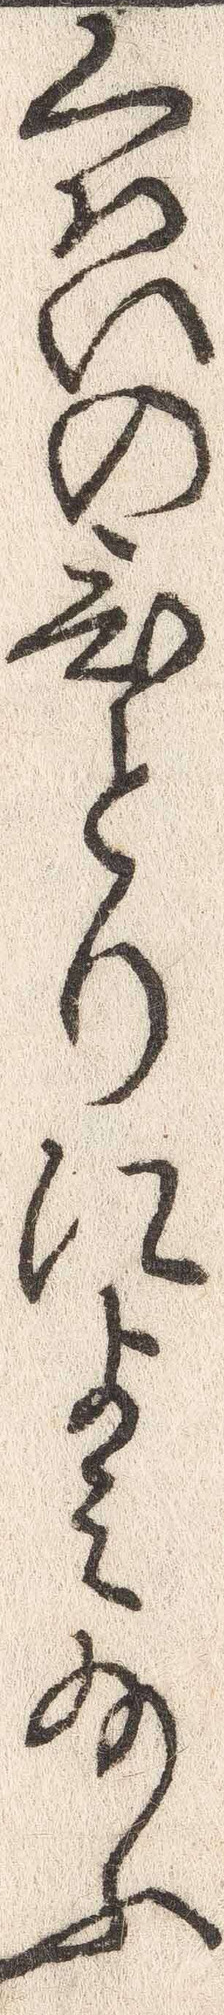くはいのひとりによみ給ふ
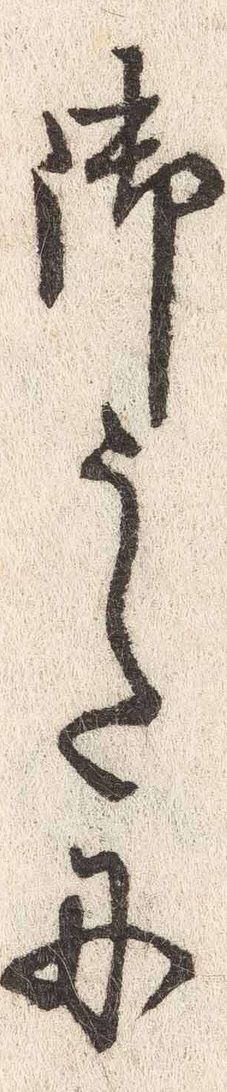御うたに
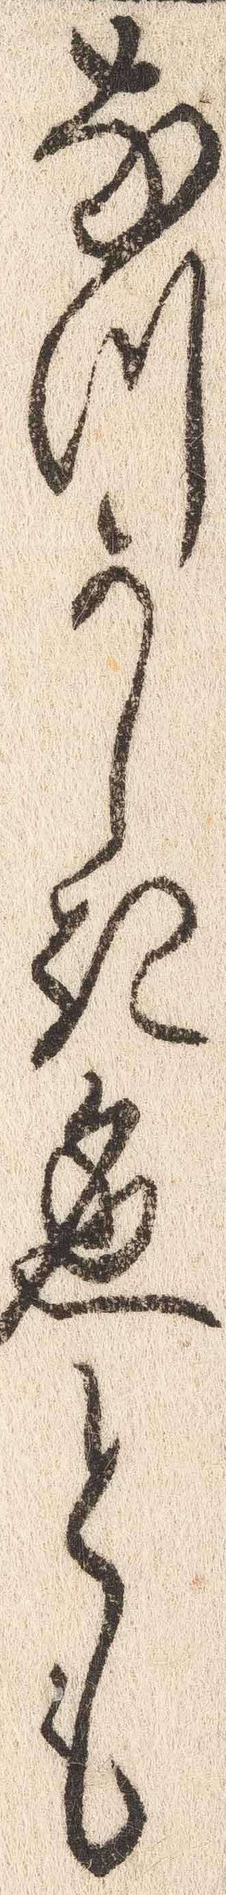なつかしき色とも
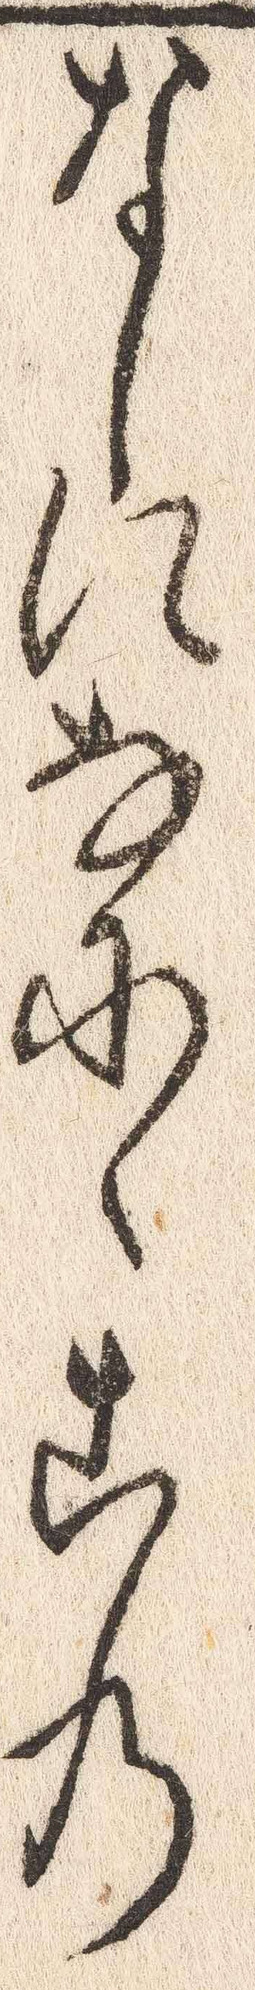なしになにゝこの
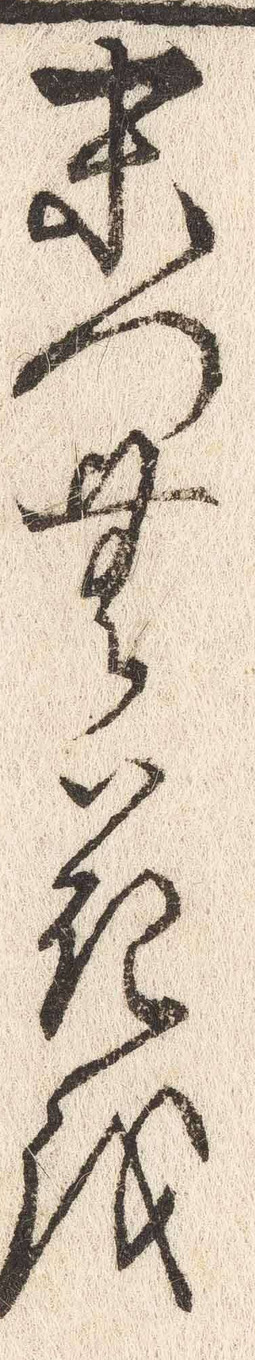末つむ花を
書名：源氏物語
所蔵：東京学芸大学附属図書館 国文学研究資料館
